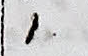1.
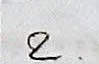2
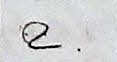2.
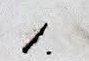1.
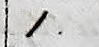1.
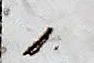1.
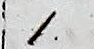1.
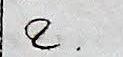2.
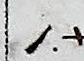1.
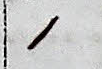1
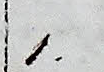1.
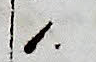1.
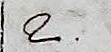2.
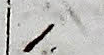1.
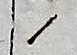1
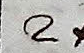2
